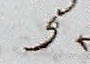5
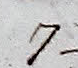7
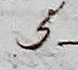5
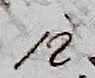12
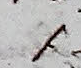1
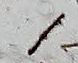1
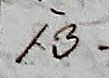13
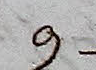9
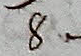8
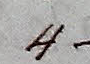4
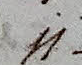11
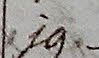19
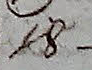18
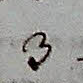3
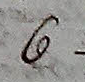6
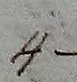4
